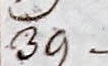39
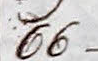66
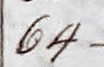64
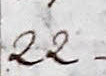22
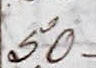50
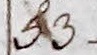53
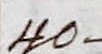40
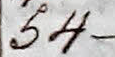54
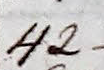42
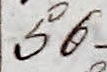56
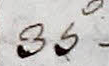35
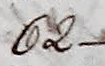62
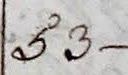53
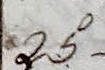25
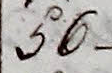56
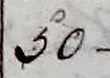50
